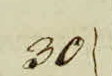30
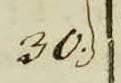30.
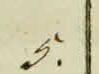5.
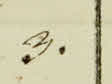3.
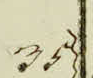35
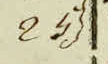25
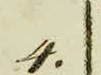4.
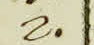2.
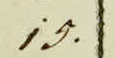15.
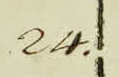24.
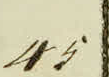45
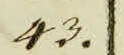43.
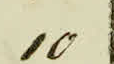10
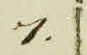7.
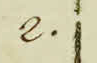2.
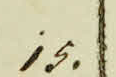15.
